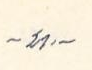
21
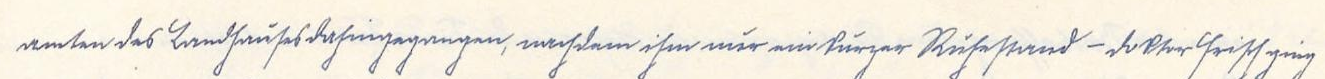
amten des Landhauses dahin gegangen, nachdem ihm nur ein kurzer Ruhestand-Dr. Frisch ging
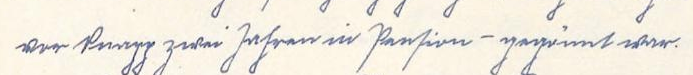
vor knapp zwei Jahren in Pension-gegönnt war
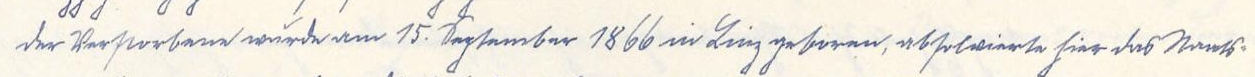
Der Verstorbene wurde am 15. September 1866 in Linz geboren, absolvierte hier das Staats-
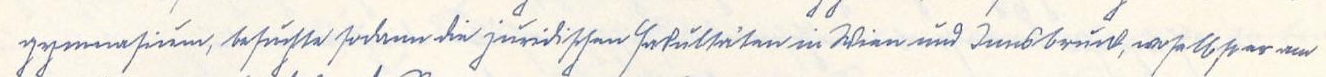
gymnasium, besuchte sodann die juridischen in Wien und Innsbruck, woselbst er am
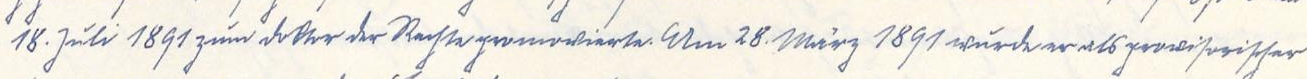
8. Juli 1891 zum Doktor der Rechte promovierte. Am 28. März 1891 wurde er als provisorischer
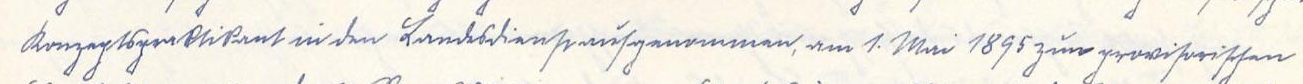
Konzeptspraktikant in den Landesdienst aufgenommen, am 1. Mai 1895 zum provisorischen
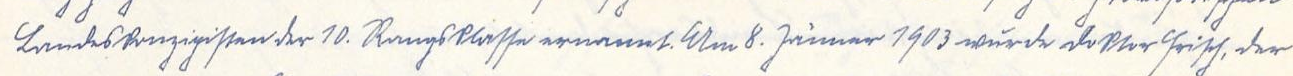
Landeskonzipisten der 10. Rangsklasse ernannt. Am 8. Jänner 1903 wurde Doktor Frisch, der
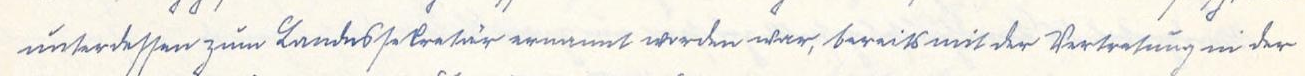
unterdessen zum Landessekretär ernannt worden war, bereits mit der Vertretung in der
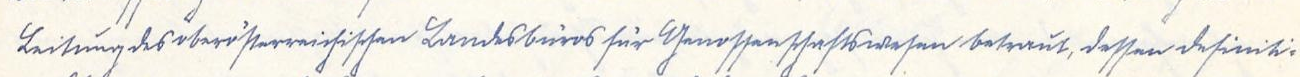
Leitung des oberösterreichischen Landesbüros für Genossenschaftswesen betraut, dessen definiti-
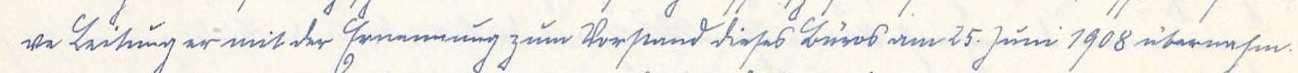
ve Leitung er mit der Ernennung zum Vorstand dieses Büros am 25. Juni 1908 übernahm.
